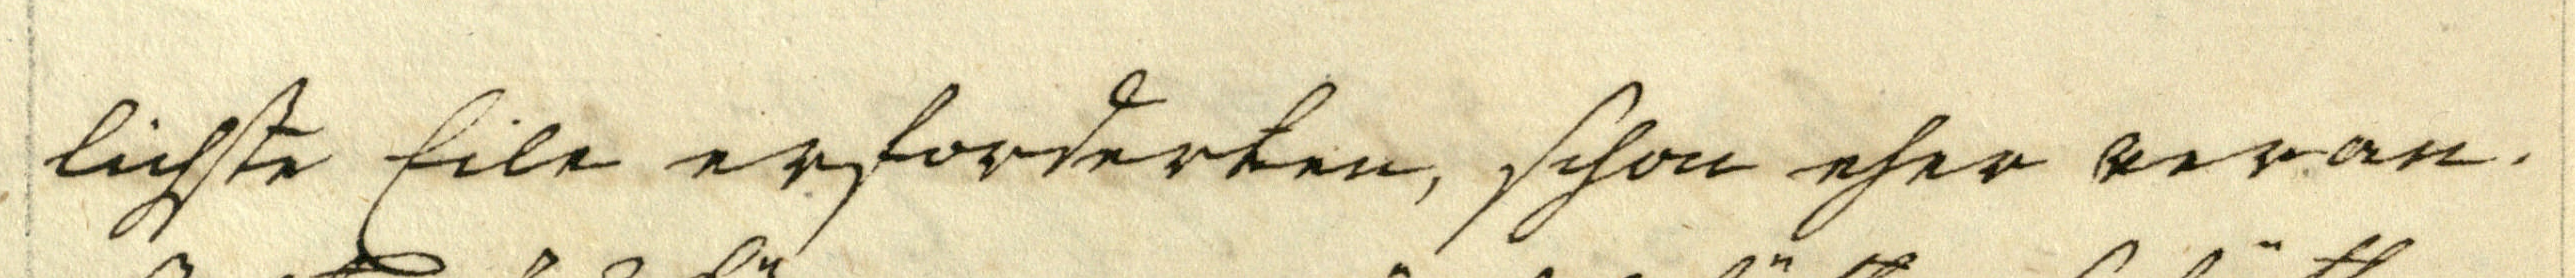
lichste Eile erforderten, schon eher veran¬
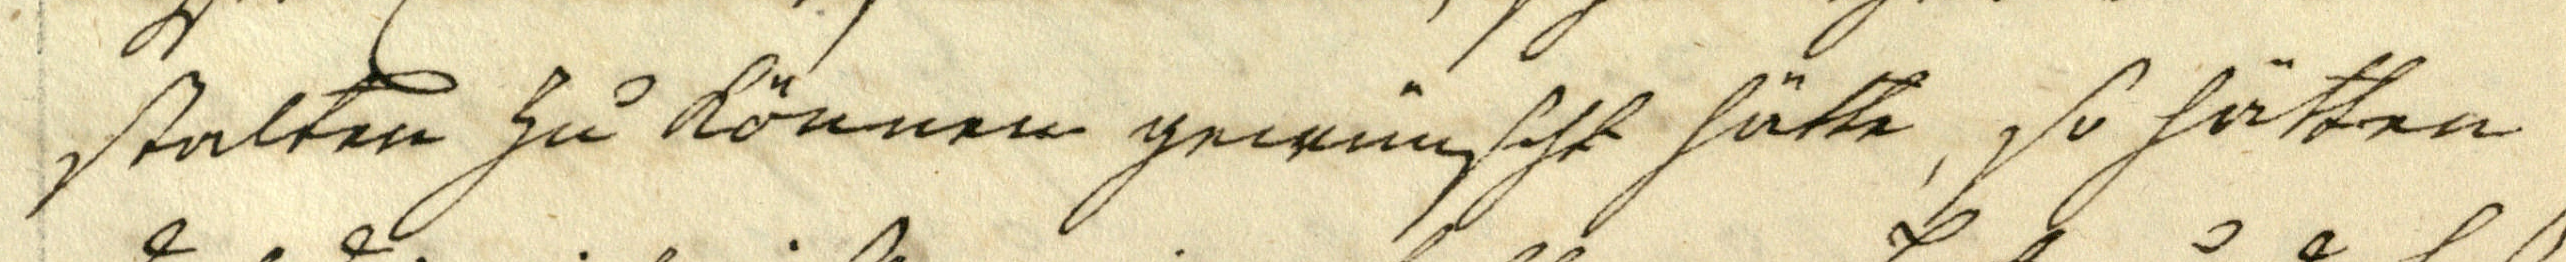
stalten zu können gewünscht hätte, so hätten
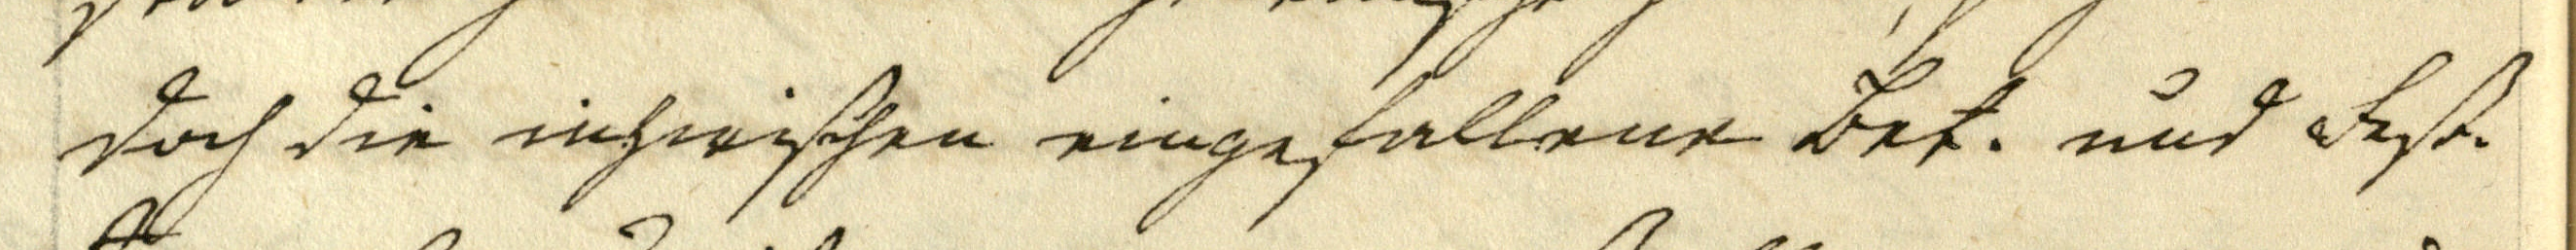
doch die inzwischen eingefallene Bet- und Fest-
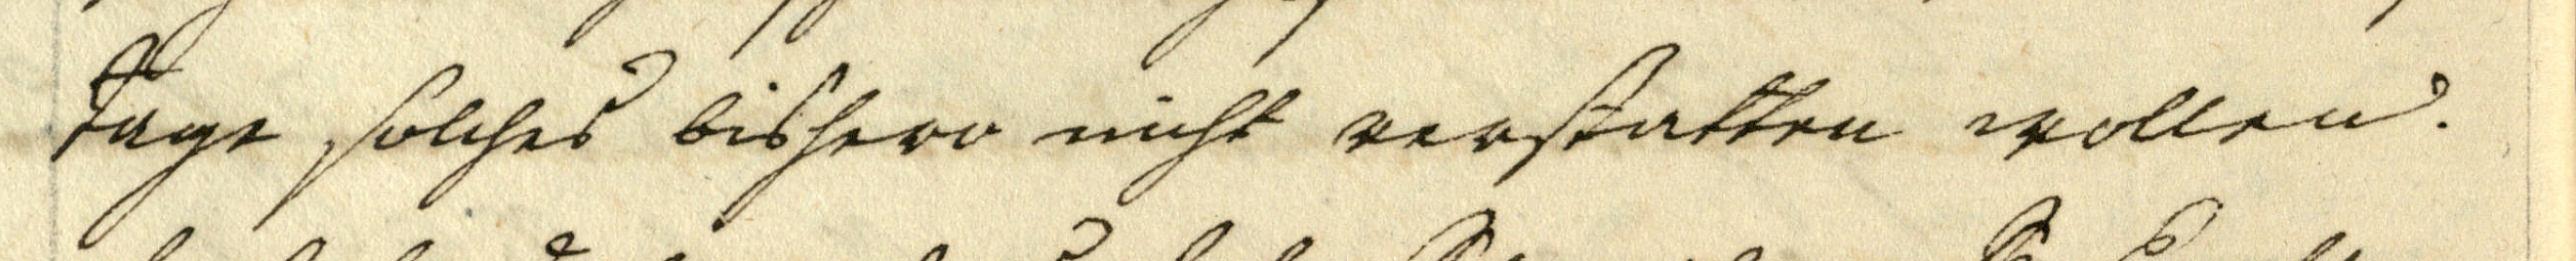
Tage solches bishero nicht verstatten wollen.
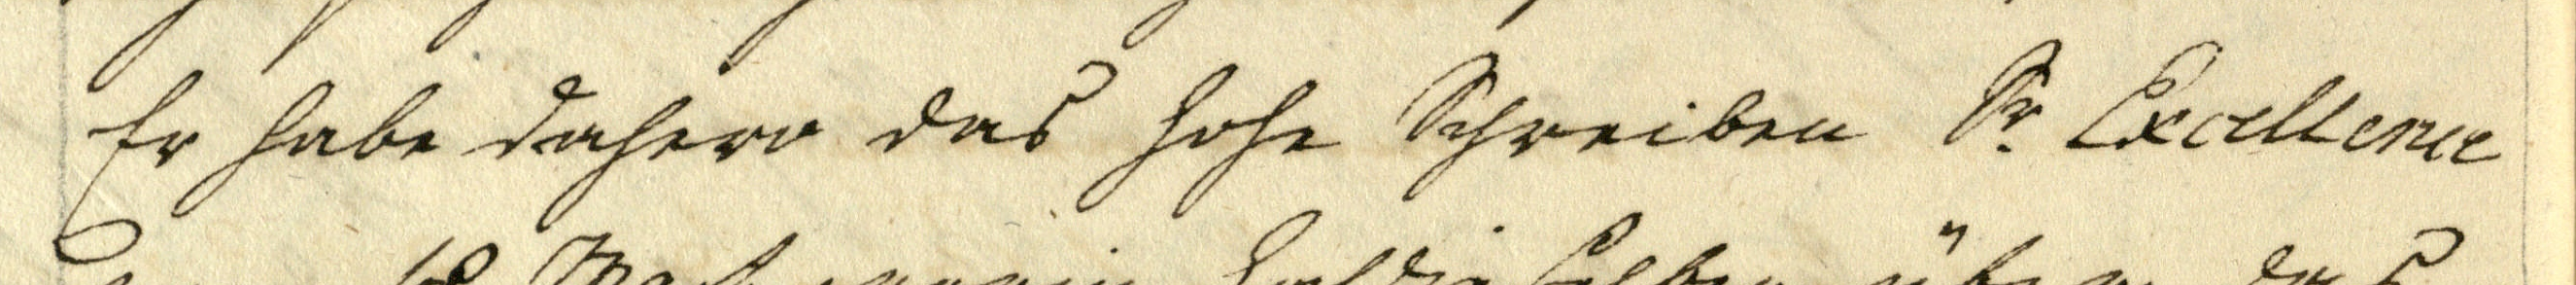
Er habe dahero das hohe Schreiben Sr Excellence
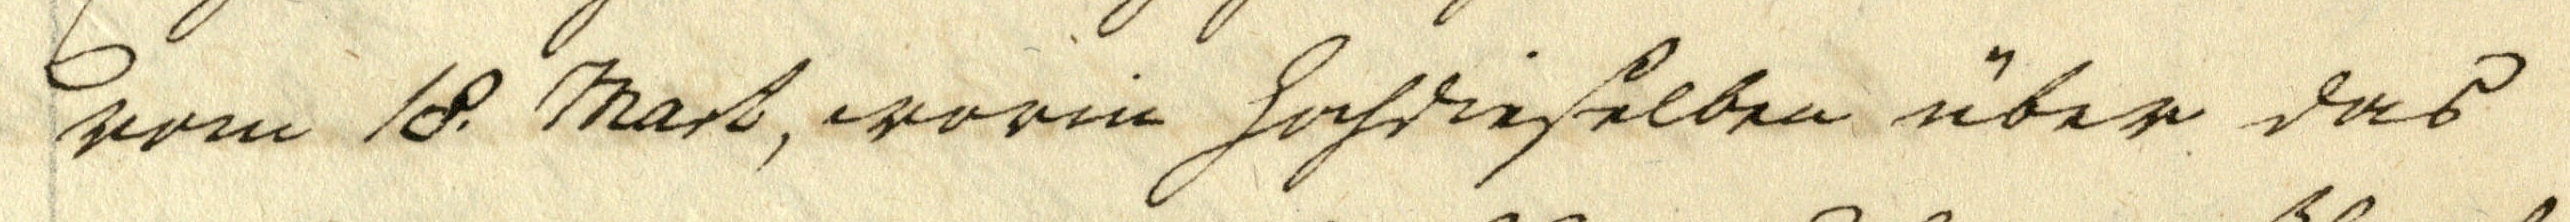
vom 18. Mart, worin Hochdieselben über das
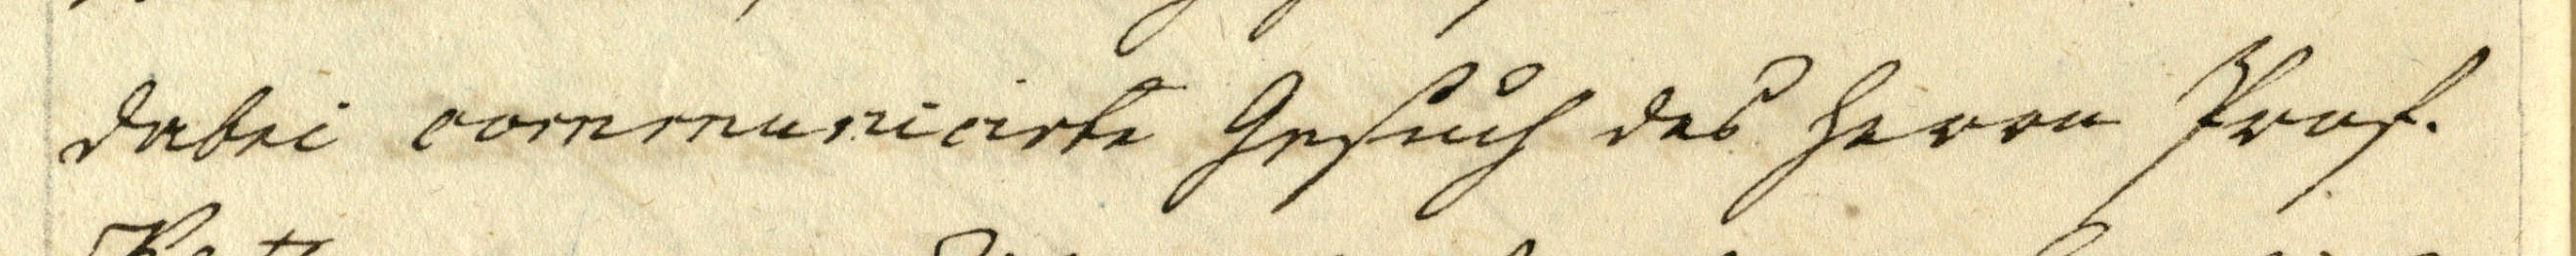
dabei communicirte Gesuch des Herrn Prof.
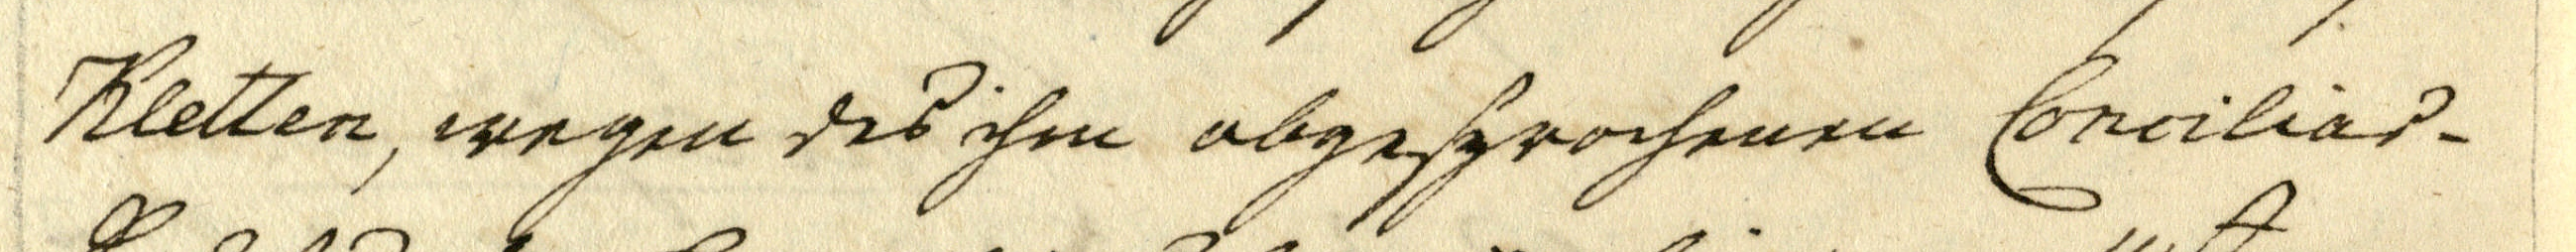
Kletten, wegen des ihm abgesprochenen Conciliar¬
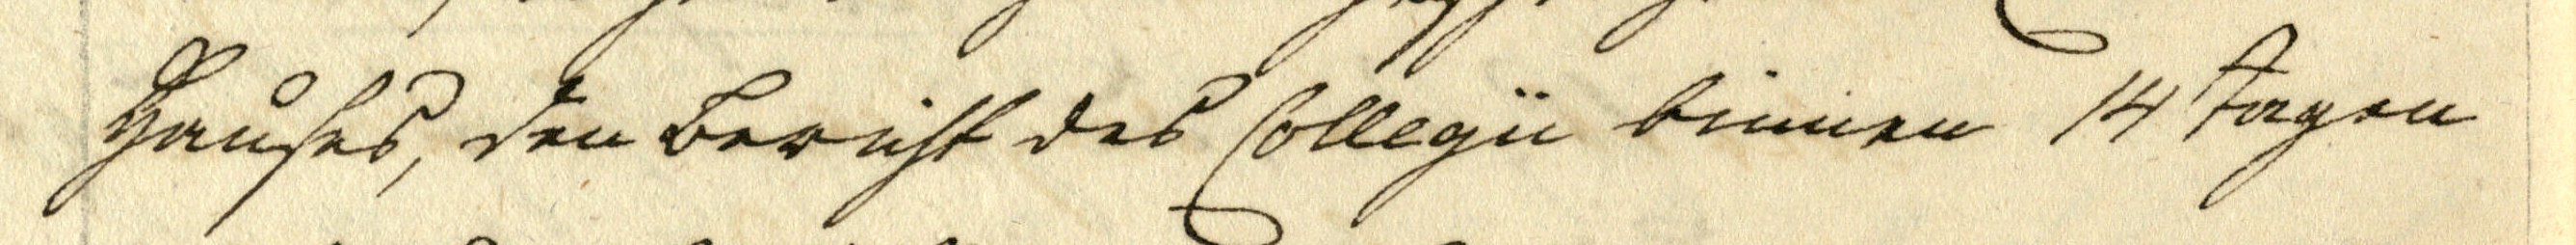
Hauses, den Bericht des Collegii binnen 14 Tagen
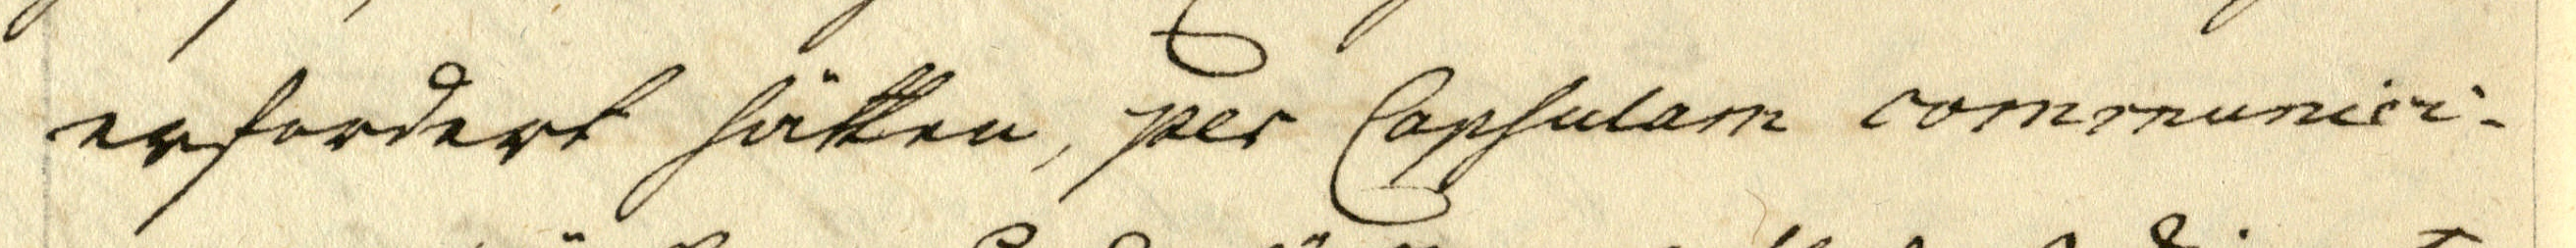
erfordert hätten, per Capsulam communici¬
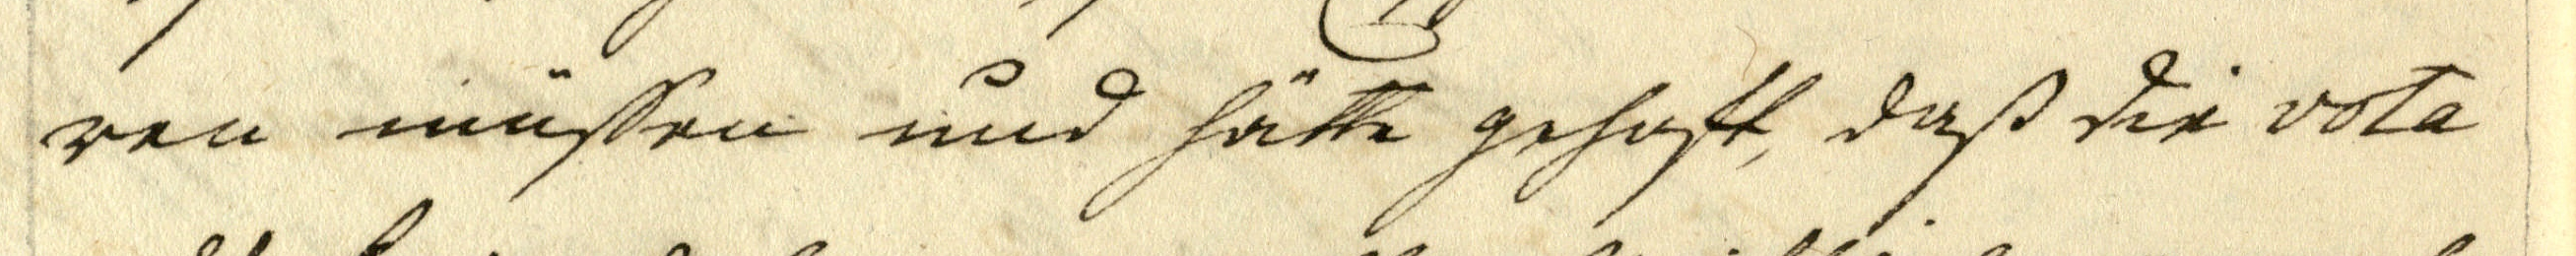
ren müssen und hätte gehoft, daß die vota
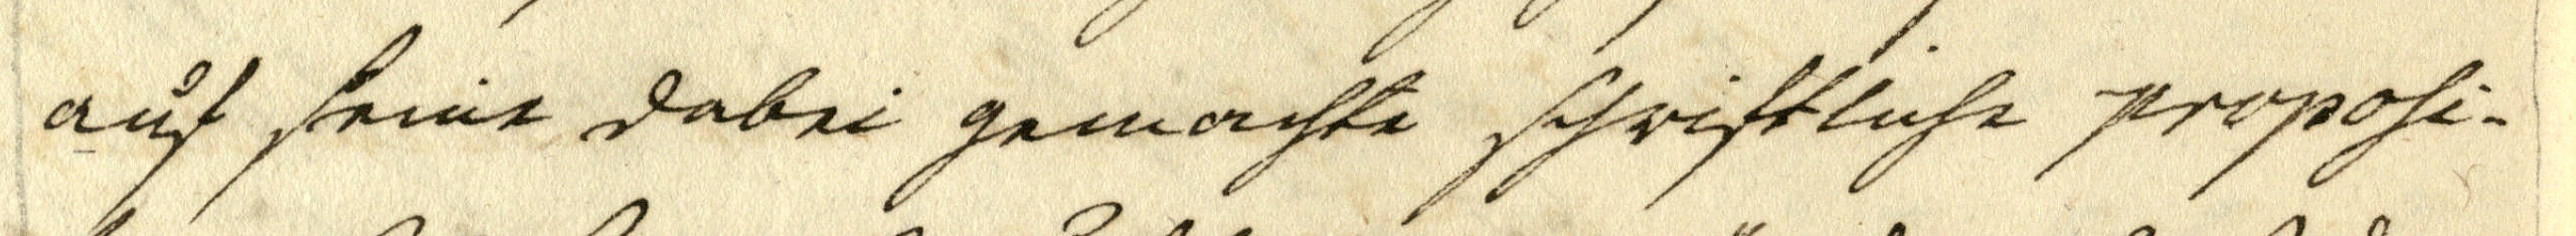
auf seine dabei gemachte schriftliche proposi¬
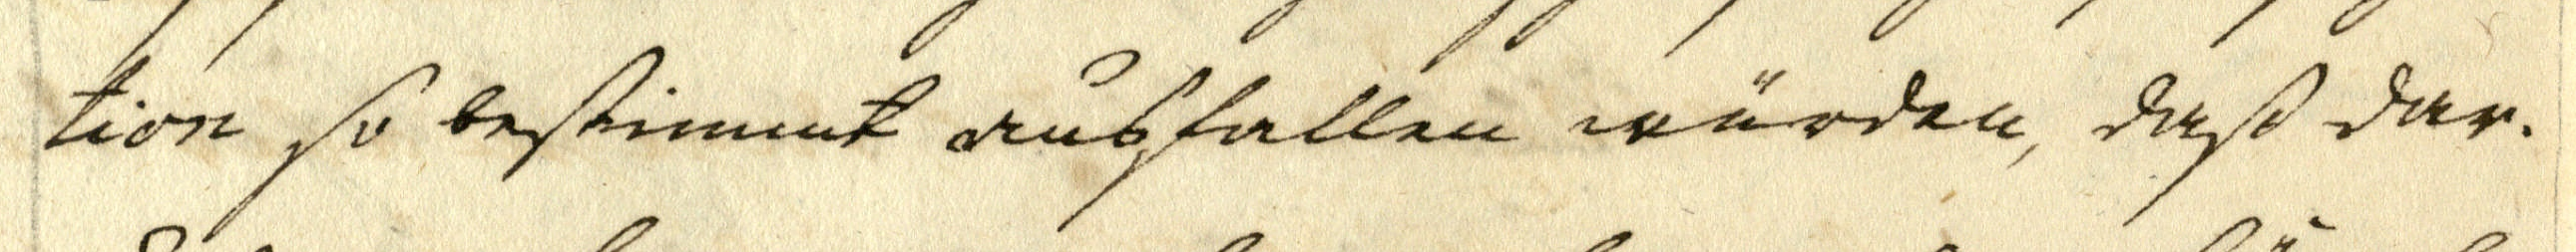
tion so bestimmt ausfallen würden, daß dar¬
